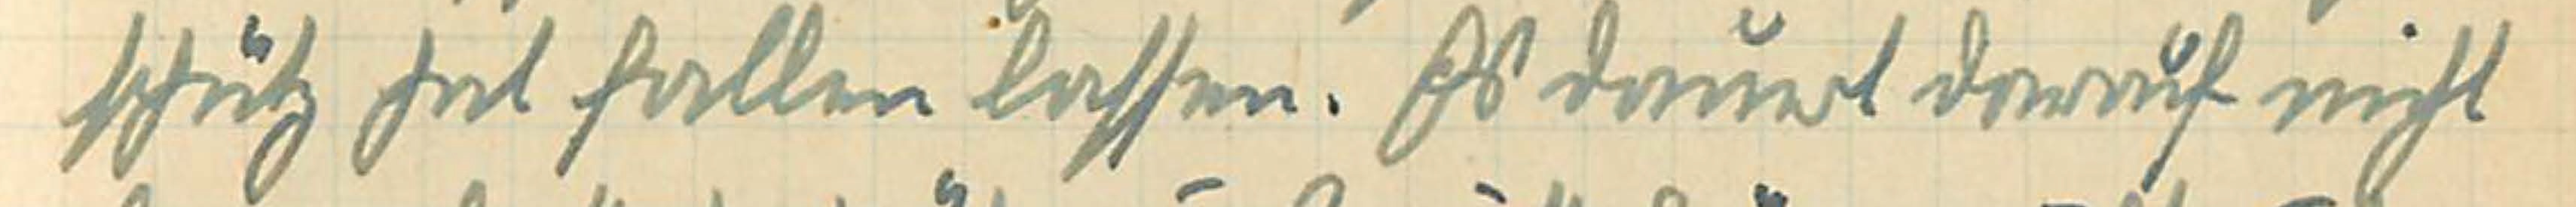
schütz hat fallen lassen. Es dauert darauf nicht
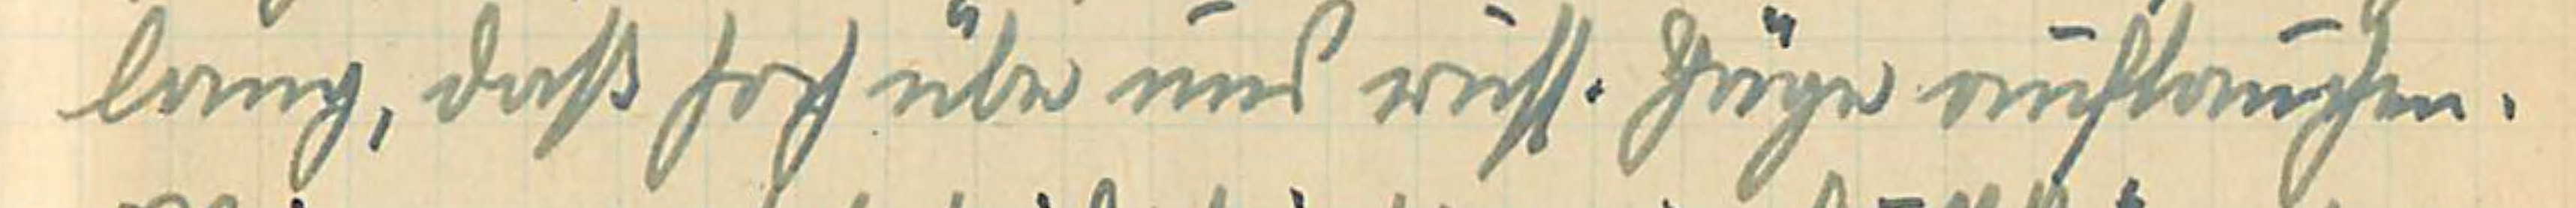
lang, daß hoch über uns russ. Jäger auftauchen.
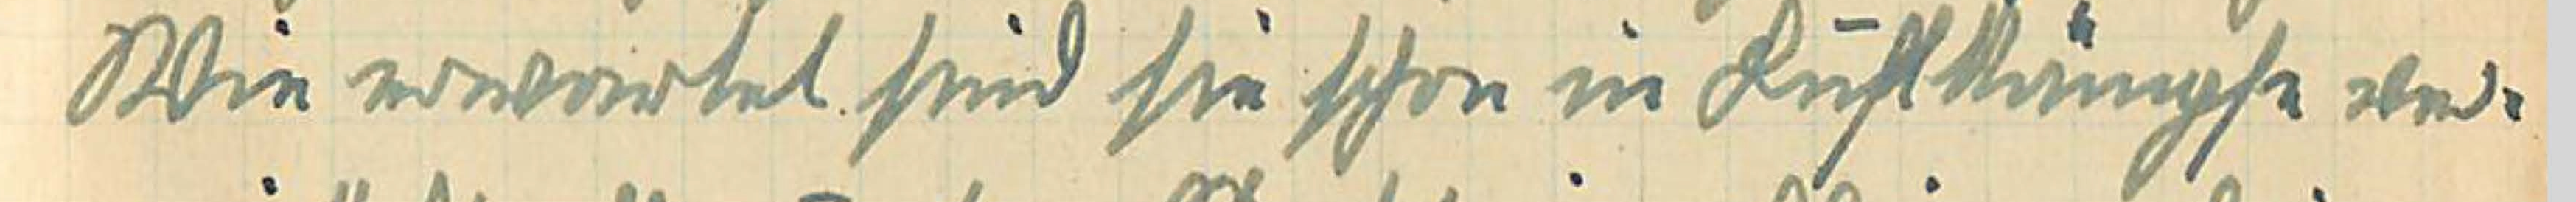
Wie erwartet sind sie schon in Luftkämpfe ver-
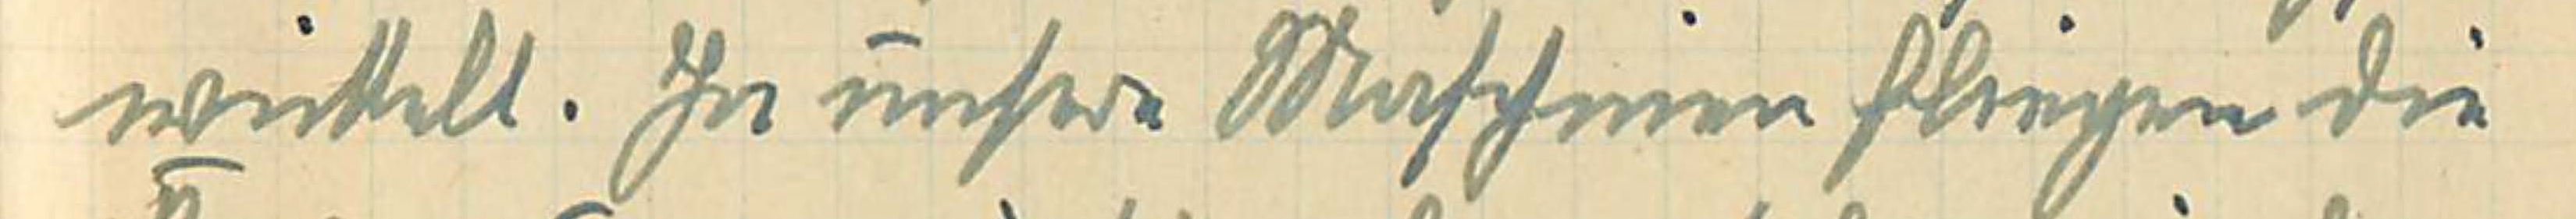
wickelt. Ja unsere Maschinen fliegen die
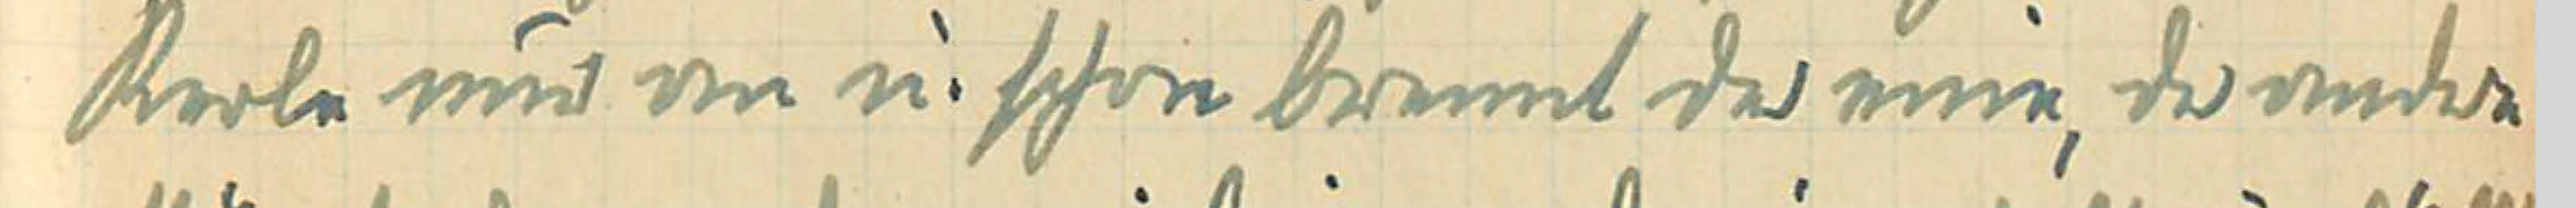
Kerle nur an u. schon brennt der eine, der andere
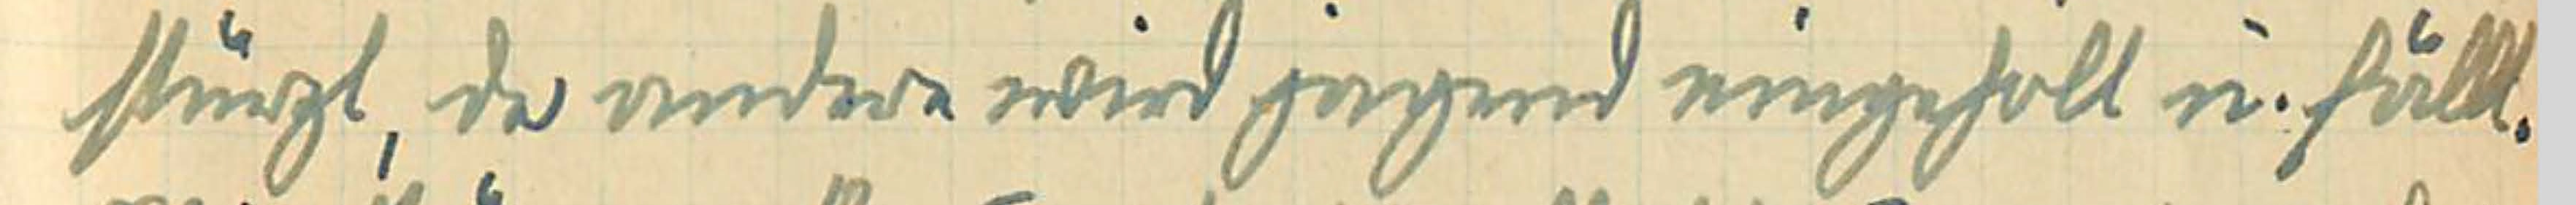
stürzt, der andere wird jagend eingeholt u. fällt.
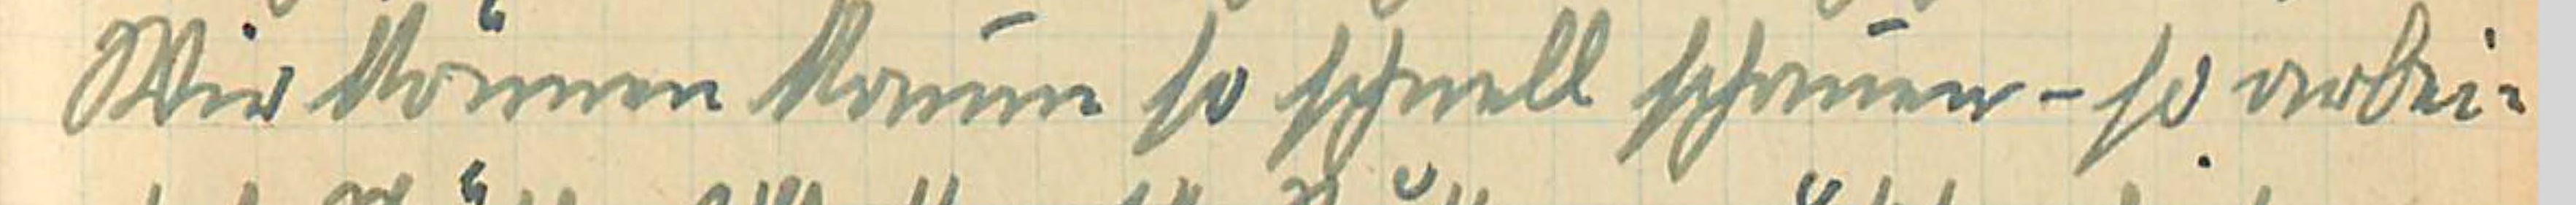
Wir können kaum so schnell schauen – so arbei-
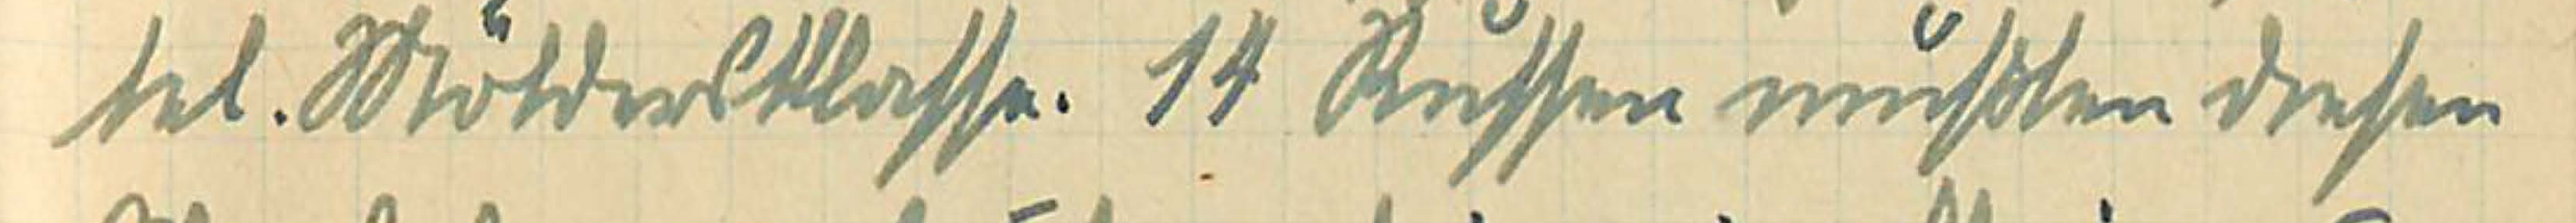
tet Möldersklasse. 14 Russen mußten diesen
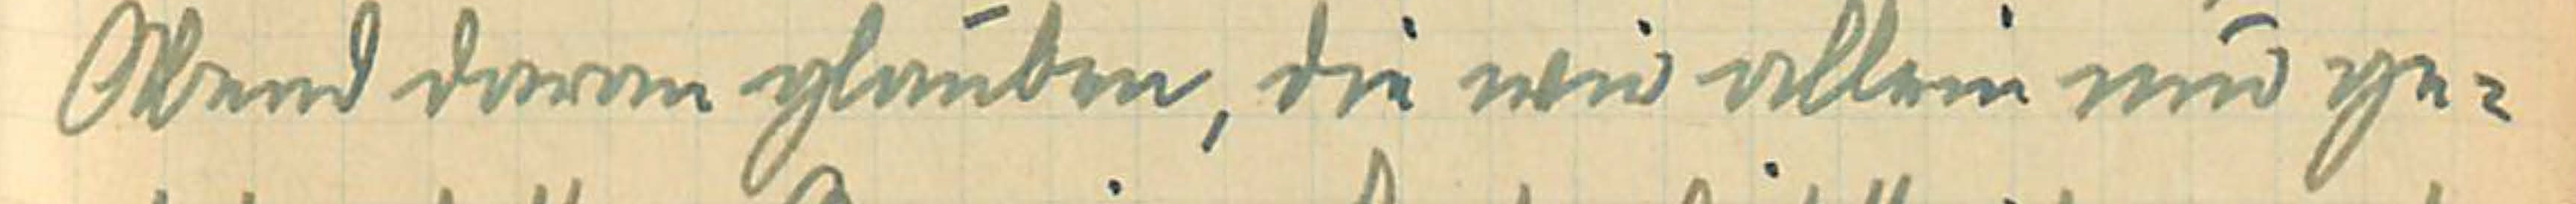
Abend daran glauben, die wir allein nur ge-
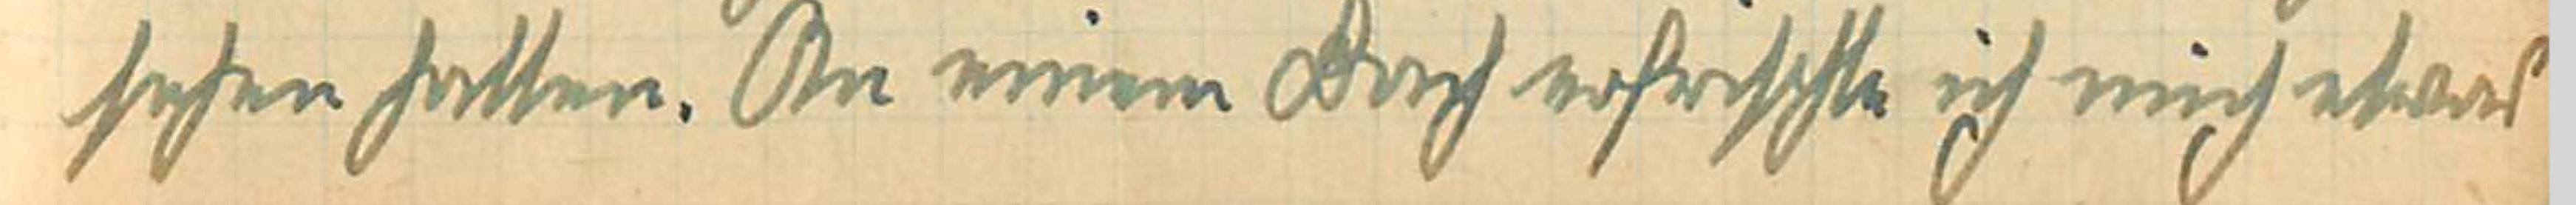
sehen hatten. An einem Bach erfrischte ich mich etwas
